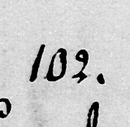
12.
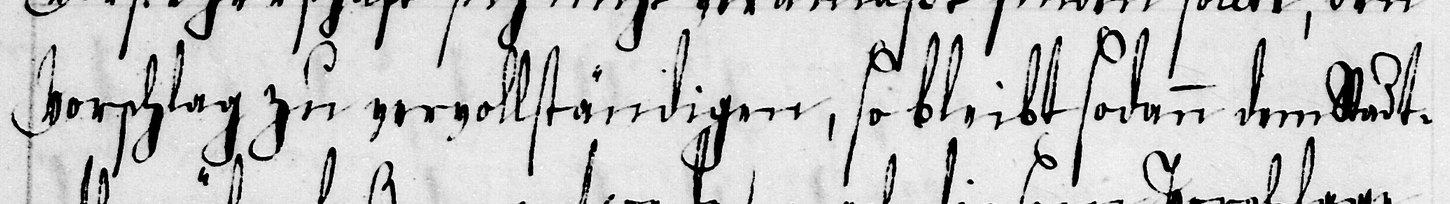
Vorschlag zu vervollständigen, so bleibt sodan¬
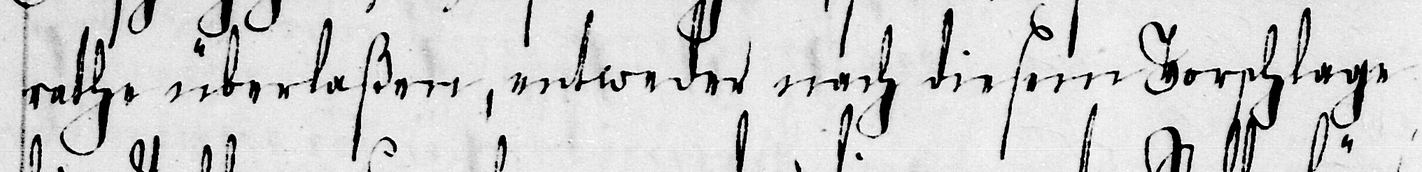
rathe überlaßen, entweder nach diesem Vorschlage
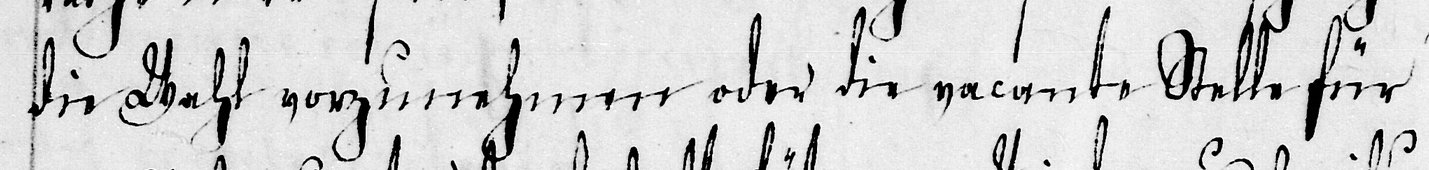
die Wahl vorzunehmen oder die vacante Stelle für
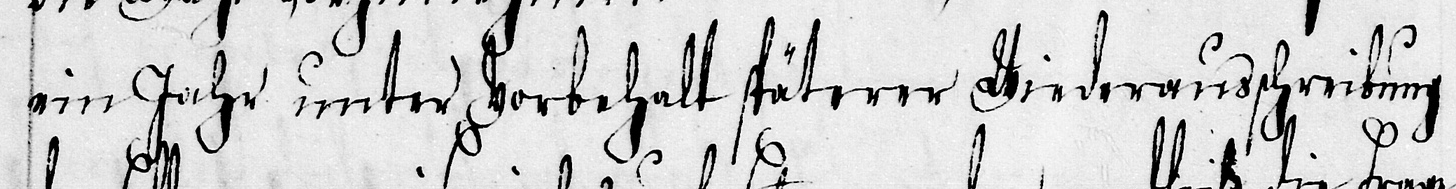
ein Jahr unter Vorbehalt späterer Wiederausschreibung
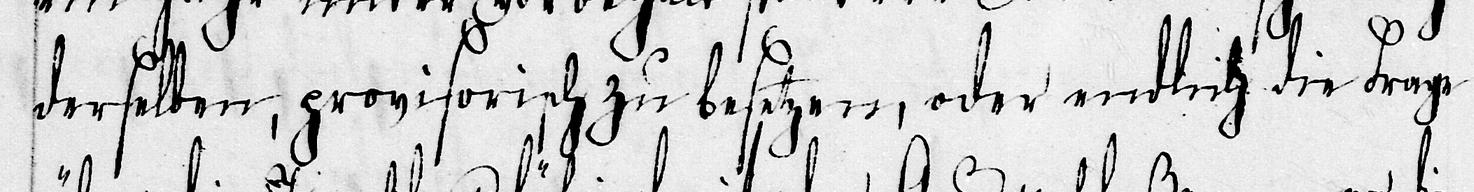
derselben, provisorisch zu besetzen, oder endlich die Frage
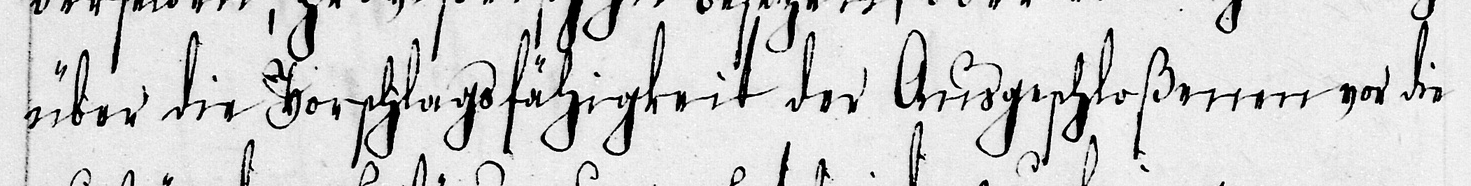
über die Vorschlagsfähigkeit der Ausgeschloßenen vor die
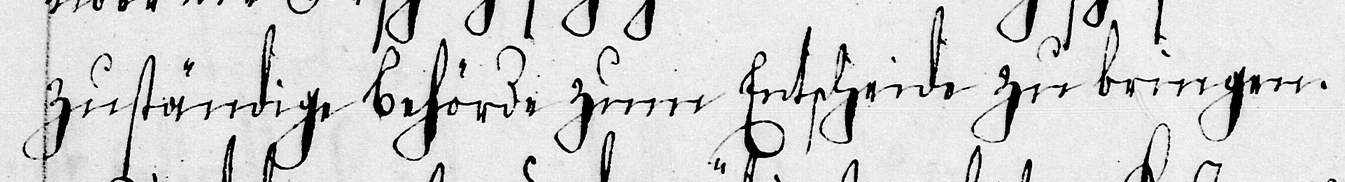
zuständige Behörde zum Entscheide zu bringen.
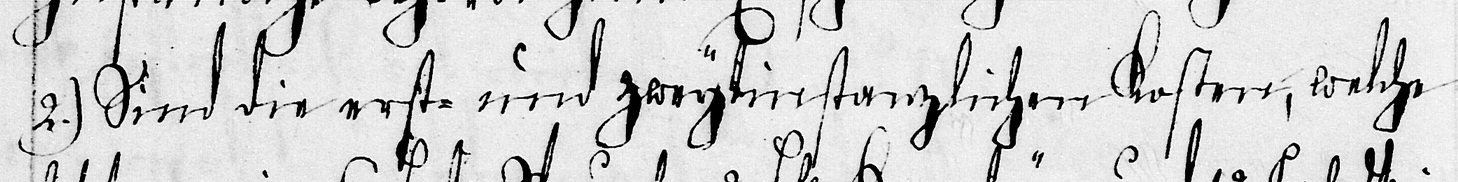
2.) Sind die erst- und zweytinstanzlichen Kosten, welche
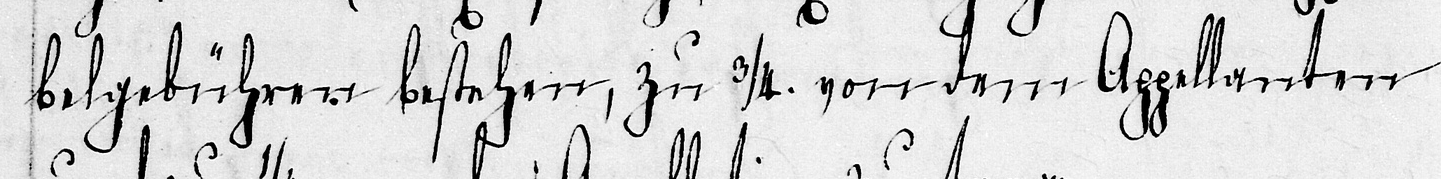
belgebühren bestehen, zu 3/4. von dem Appellanten
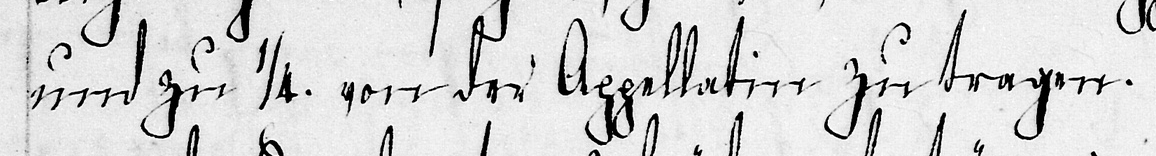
und zu 1/4. von der Appellatin zu tragen.
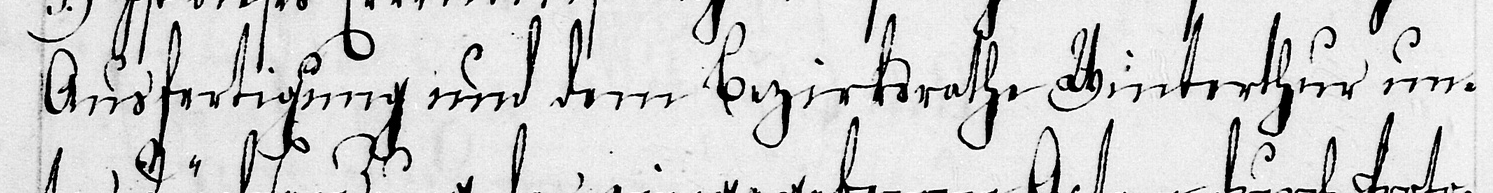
Ausfertigung und dem Bezirksrathe Winterthur un¬
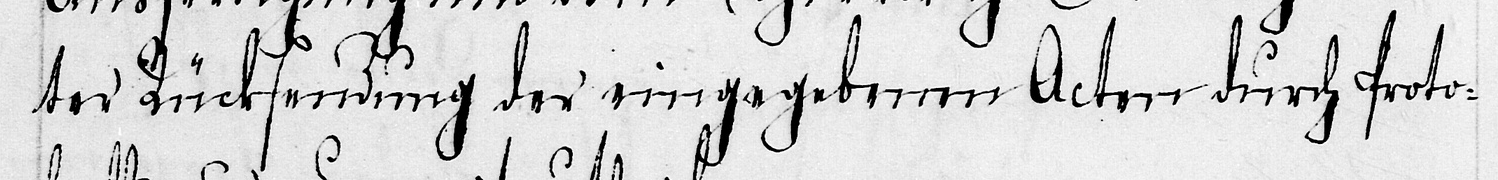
ter Rücksendung der eingegebenen Acten durch Proto¬
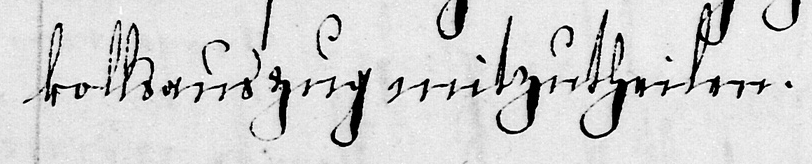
kollsauszug mitzutheilen.
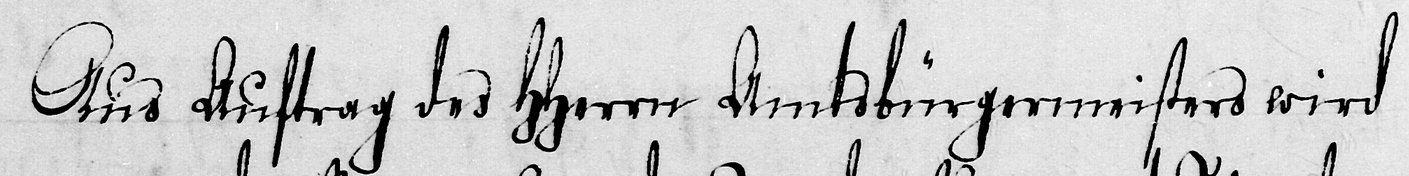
Aus Auftrag des HHerrn Amtsbürgermeisters wird
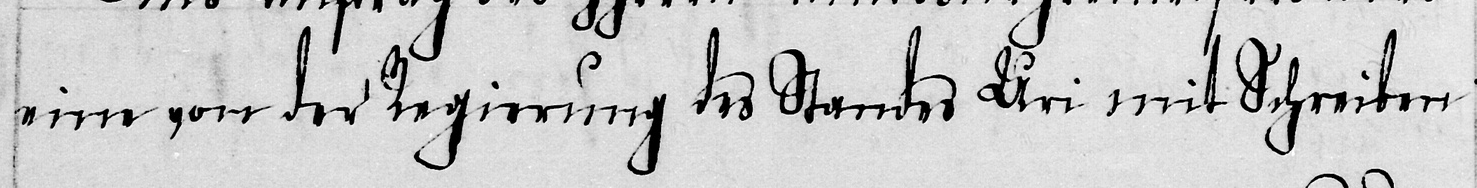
eine von der Regierung des Standes Uri mit Schreiben
